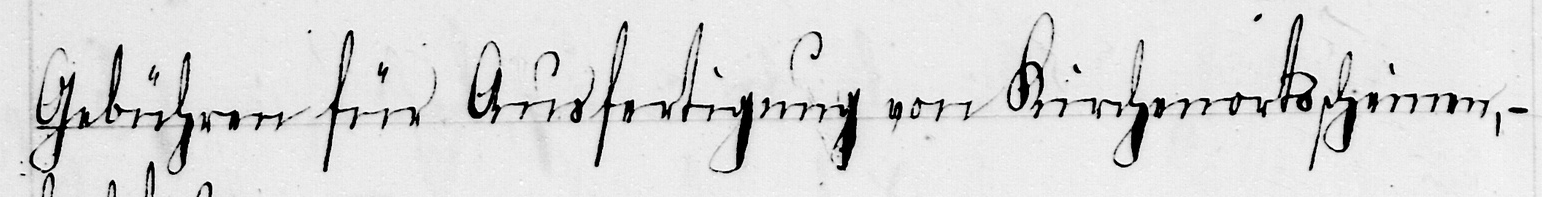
Gebühren für Ausfertigung von Kirchenortsscheinen,
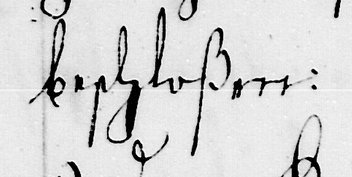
beschloßen:
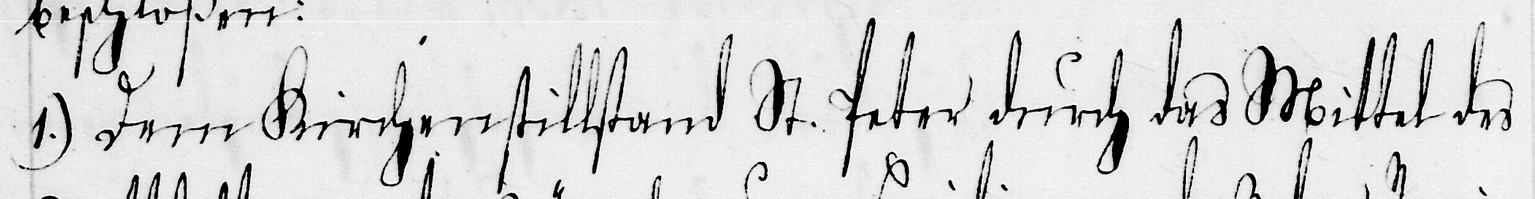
1.) Dem Kirchenstillstand St. Peter durch das Mittel des
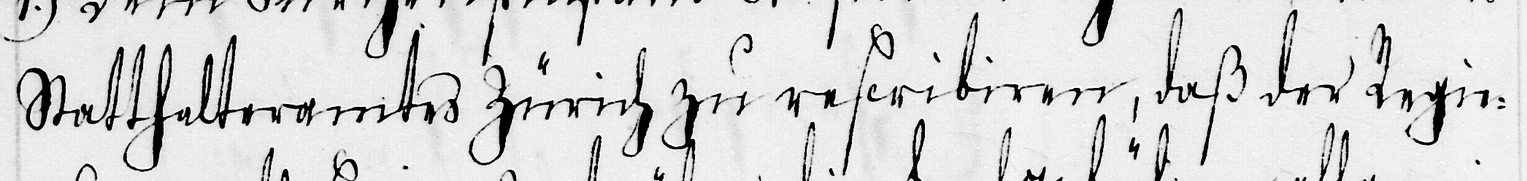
Statthalteramtes Zürich zu rescribiren, daß der Regie¬
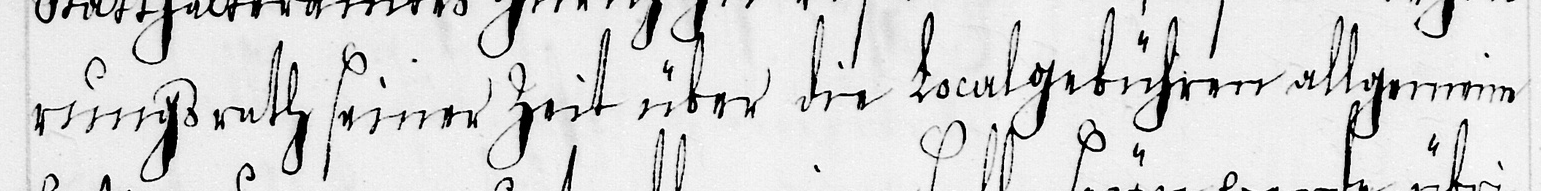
rungsrath seiner Zeit über die Localgebühren allgemeine
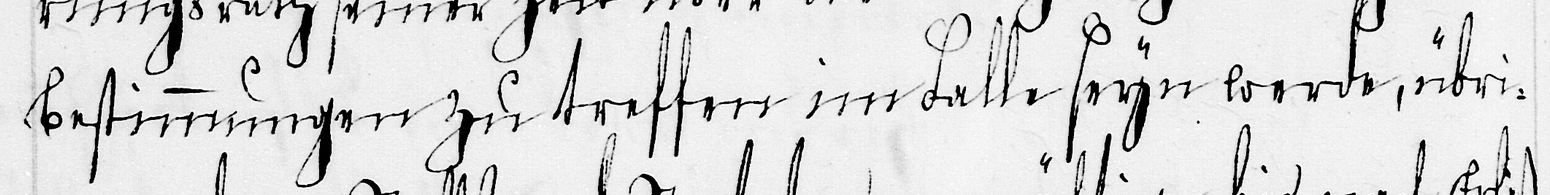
Bestimmungen zu treffen im Falle seyn werde, übri¬
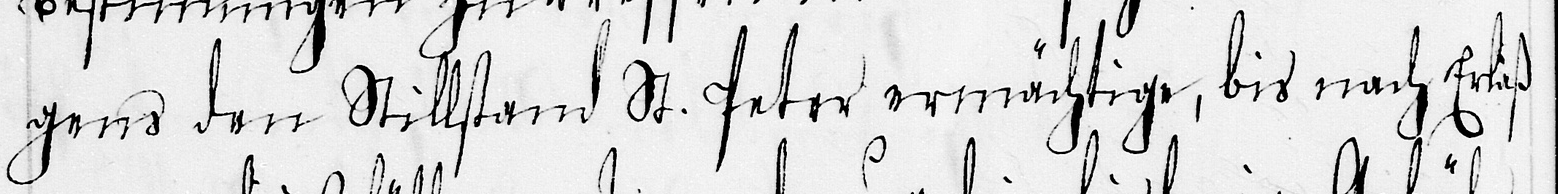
gens den Stillstand St. Peter ermächtige, bis nach Erlaß
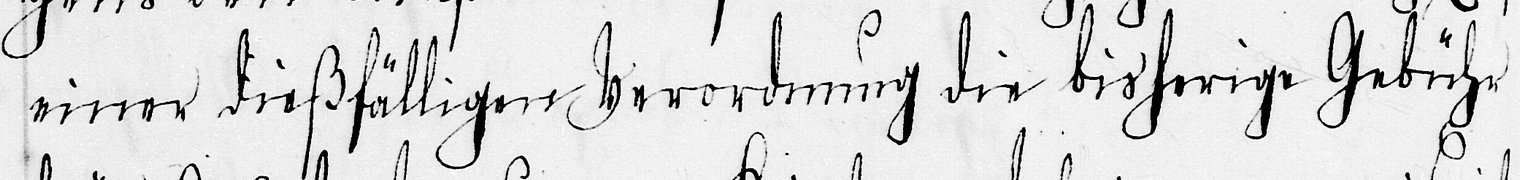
einer dießfälligen Verordnung die bisherige Gebühr
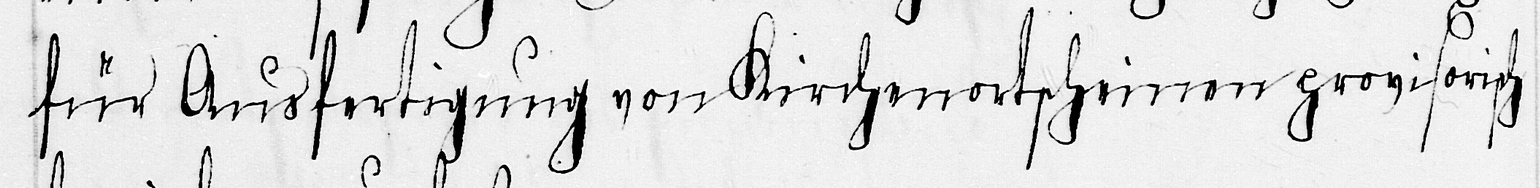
für Ausfertigung von Krichenortscheinen provisorisch
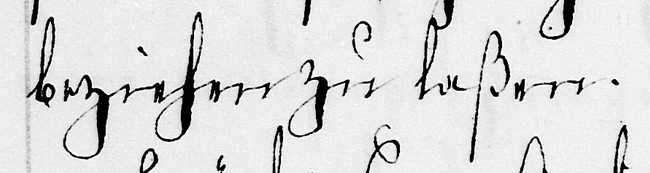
beziehen zu laßen.
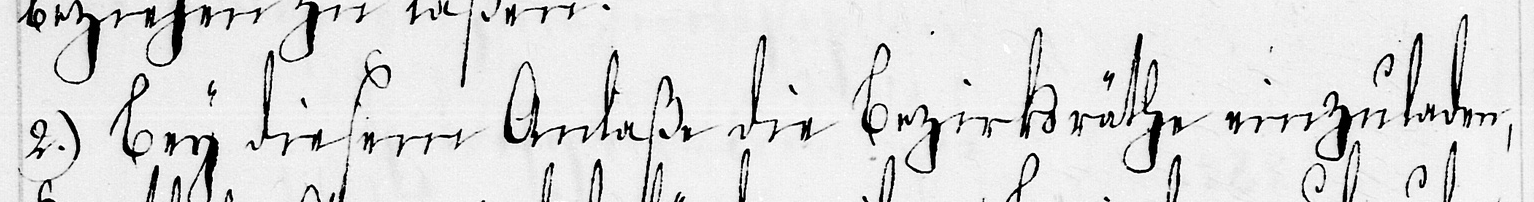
2.) Bey diesem Anlaße die Bezirksräthe einzuladen,
